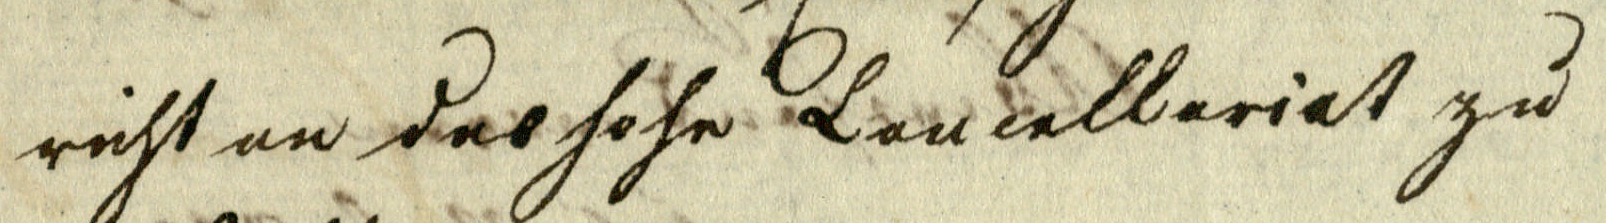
richt an das hohe Cancellariat zu
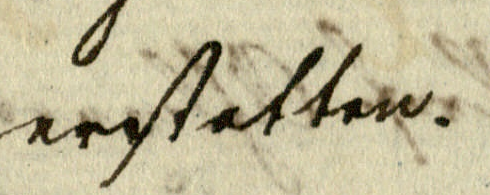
erstatten.
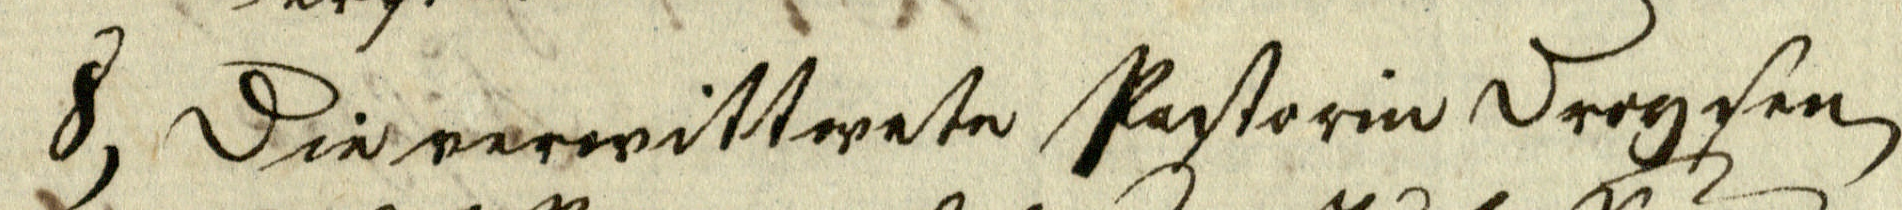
8, Die verwittwete Pastorin Droysen
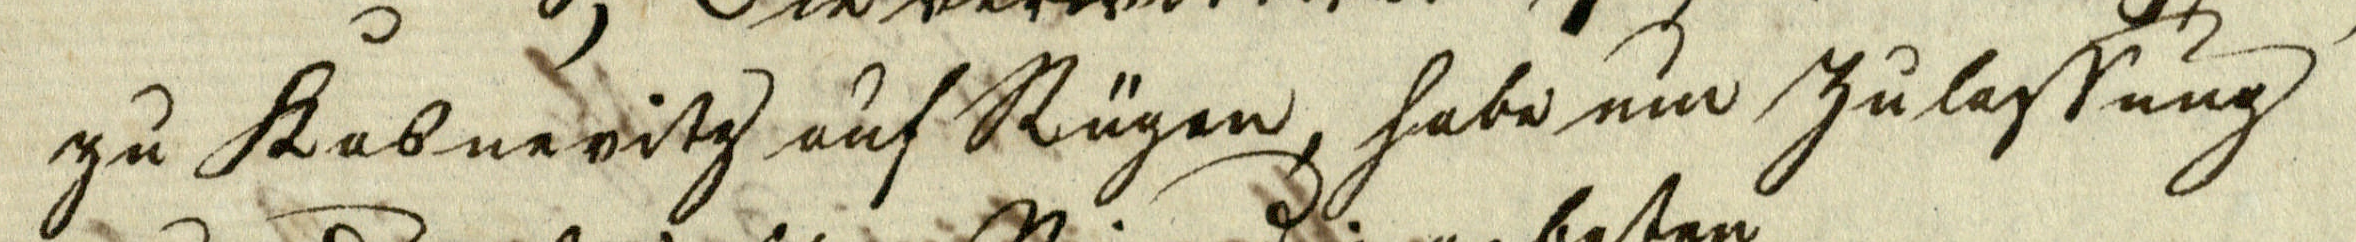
zu Kasnevitz auf Rügen, habe um Zulassung
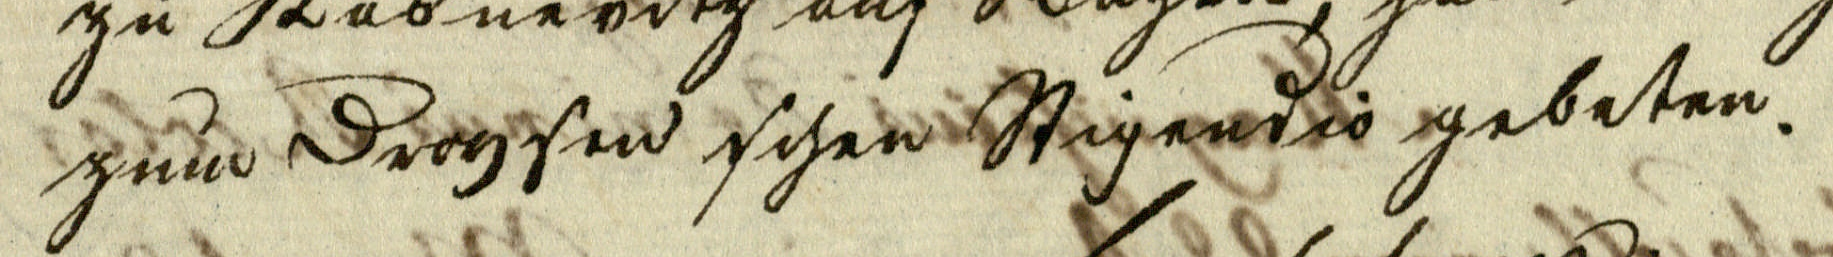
zum Droysen'schen Stipendio gebeten.
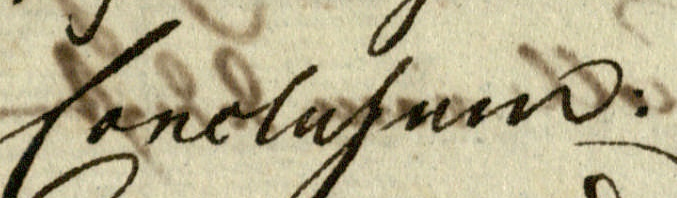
Conclusum:
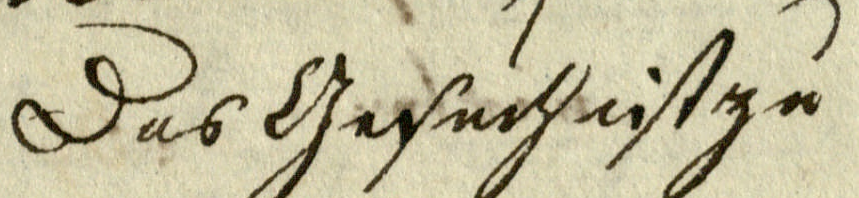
Das Gesuch ist zu
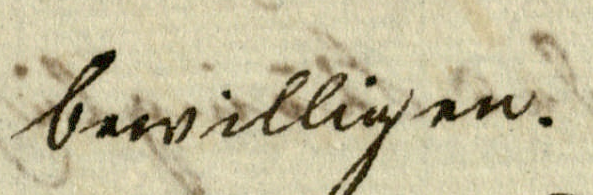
bewilligen.
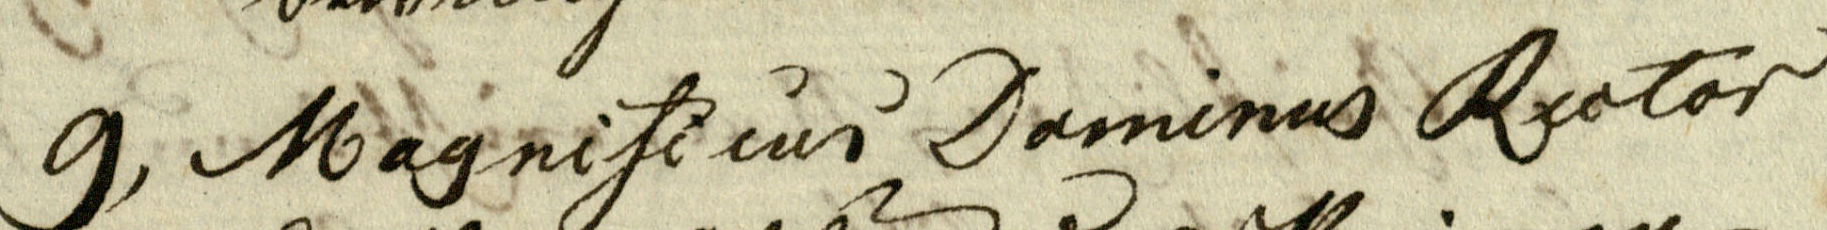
9, Magnificus Dominus Rector
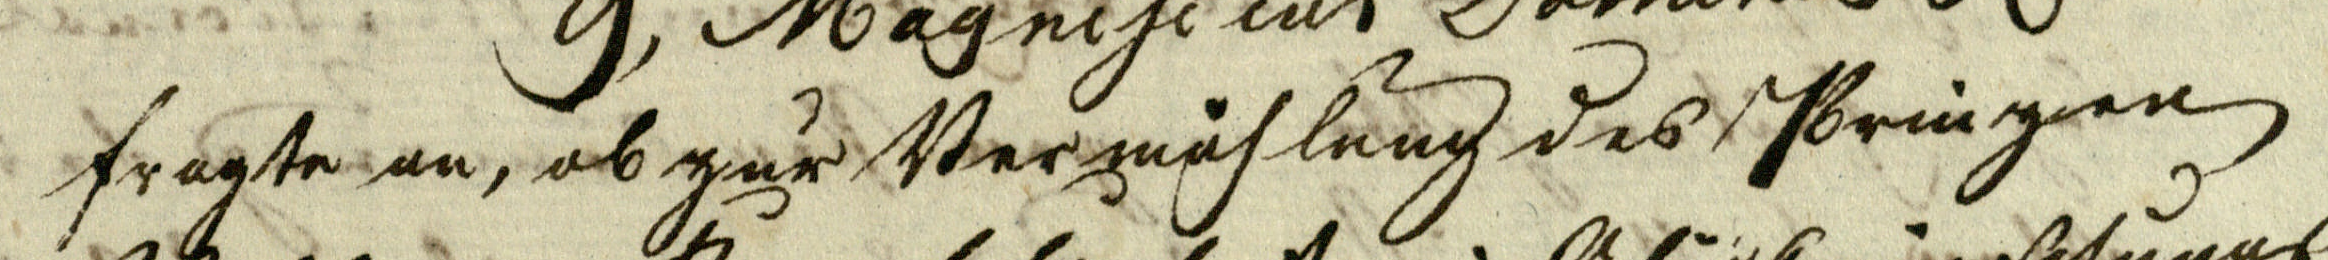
fragte an, ob zur Vermählung des Prinzen
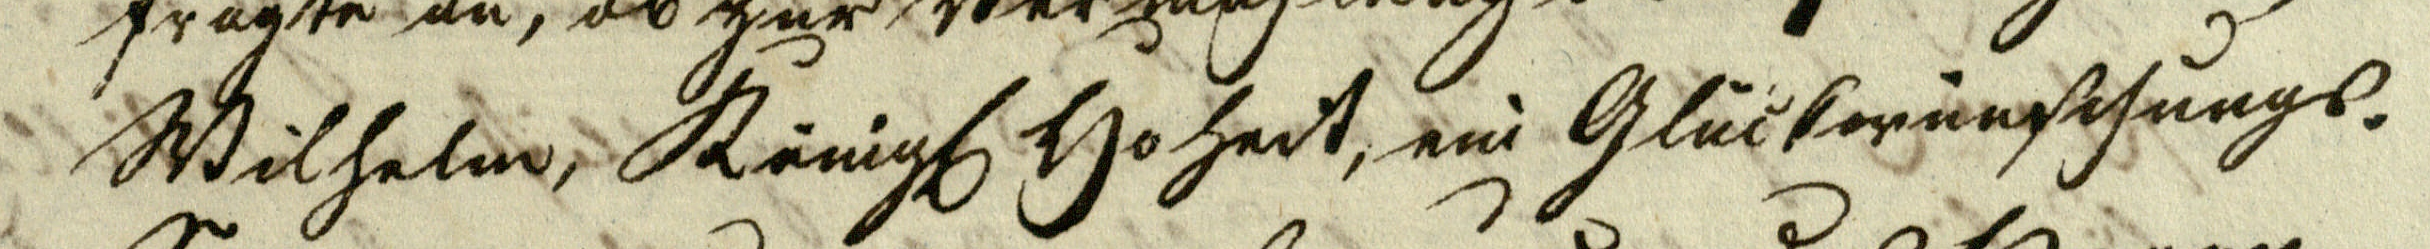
Wilhelm, Königl Hoheit, ein Glückwünschungs¬
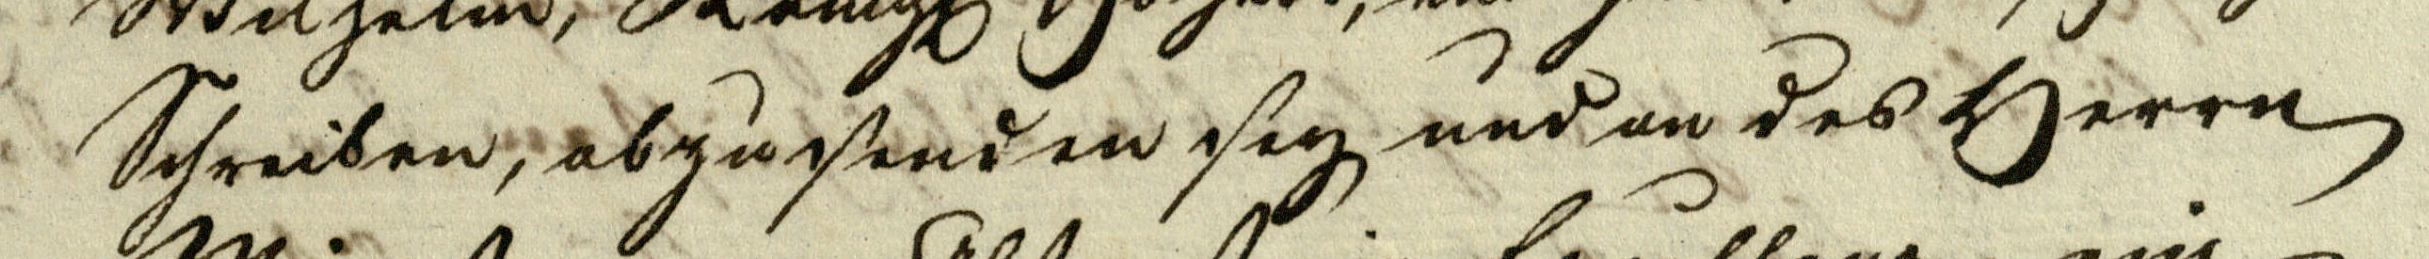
Schreiben, abzusenden sey und an des Herrn
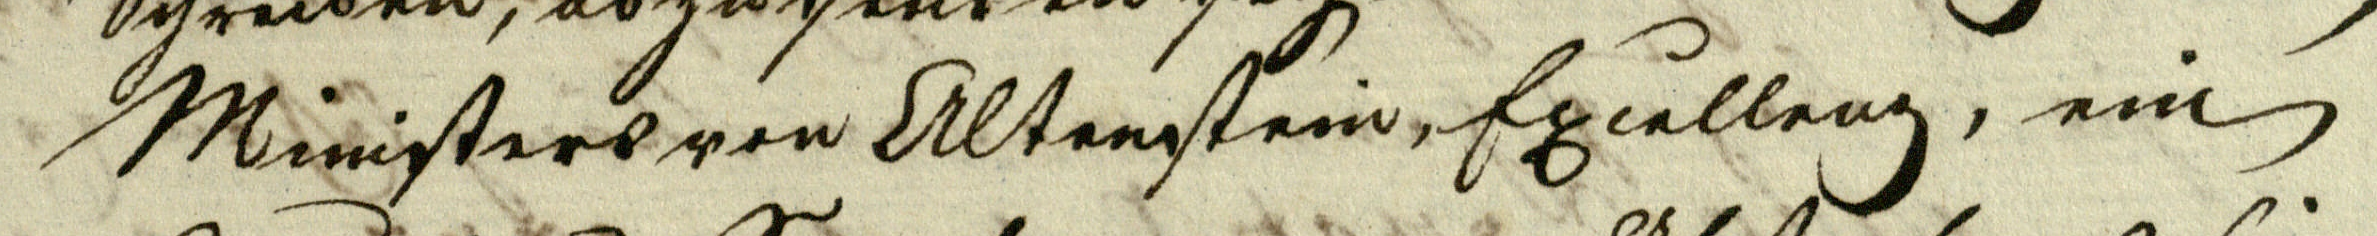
Ministers von Altenstein Excellenz, ein
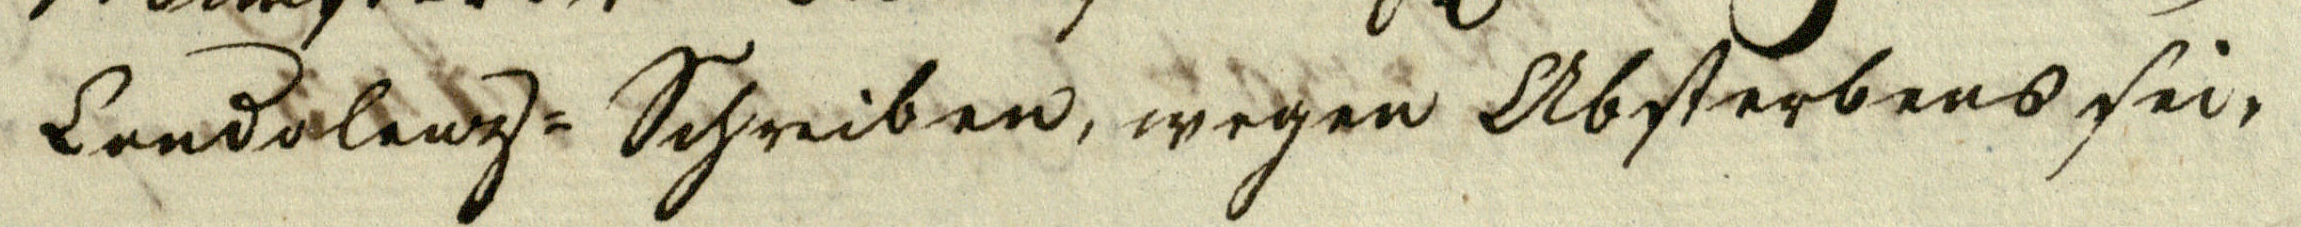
Condolenz-Schreiben, wegen Absterbens sei¬
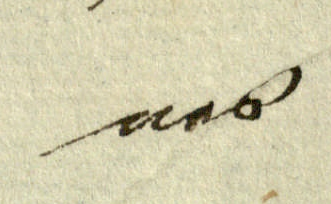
nes
